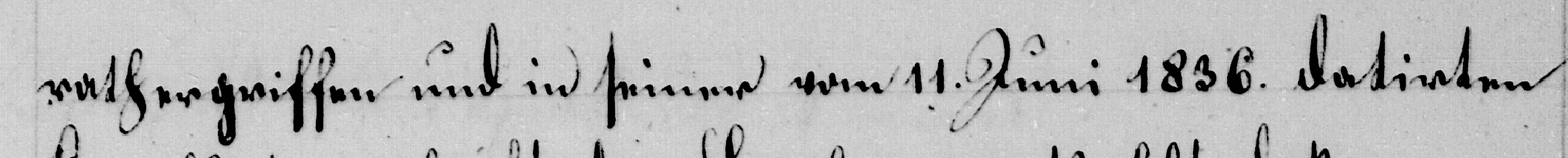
rath ergriffen und in seiner vom 11. Juni 1836. datirten
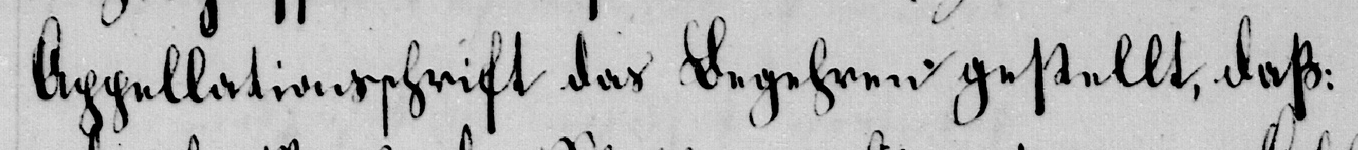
Appellationsschrift das Begehren gestellt, daß:
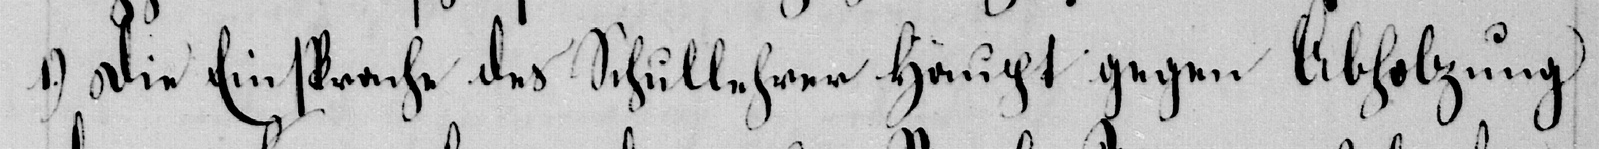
1.) Die Einsprache des Schullehrer Haupt gegen Abholzung
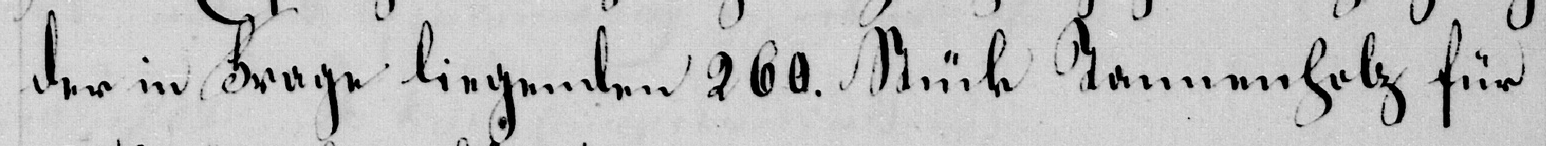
der in Frage liegenden 260. Stück Tannenholz für
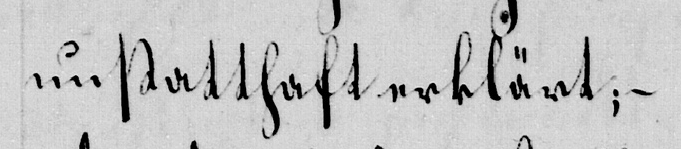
unstatthaft erklärt; –
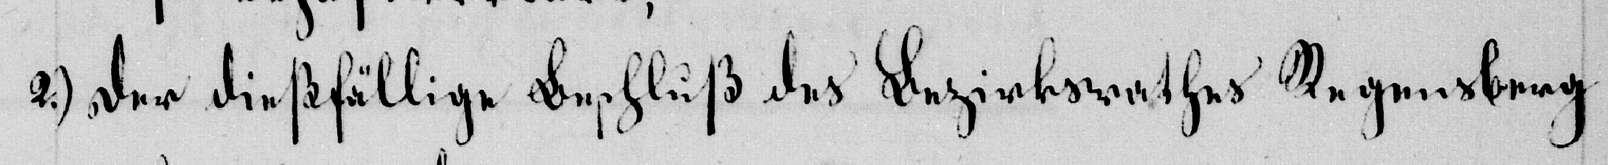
2.) Der dießfällige Beschluß des Bezirksrathes Regensberg
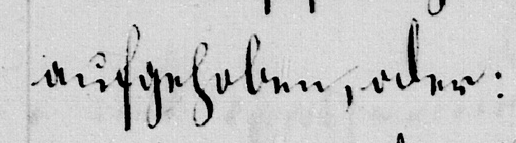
aufgehoben, oder:
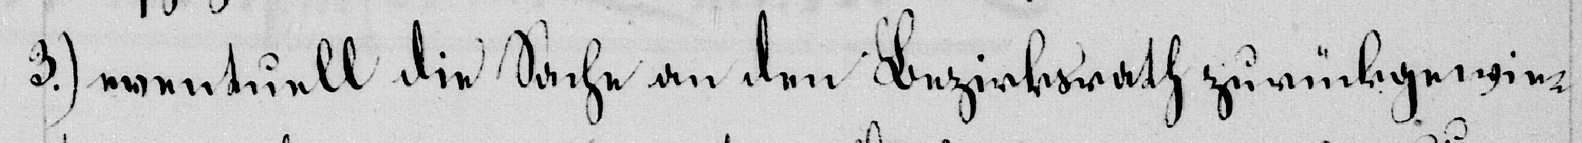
3.) eventuell die Sache an den Bezirksrath zurückgewie¬
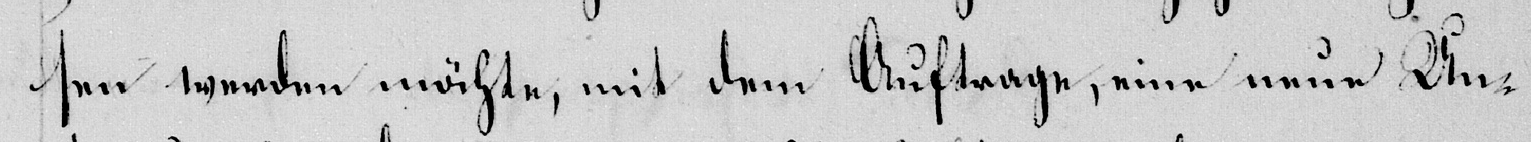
sen werden möchte, mit dem Auftrage, eine neue Un¬
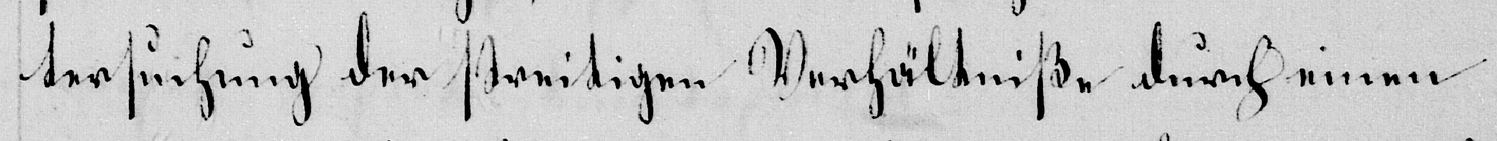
tersuchung der streitigen Verhältniße durch einen
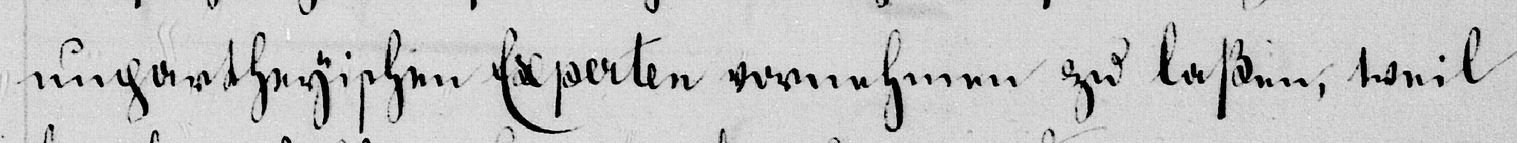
unpartheyischen Experten vornehmen zu laßen, weil
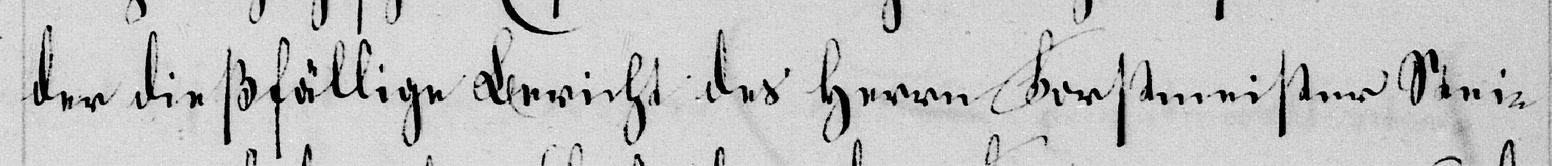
der dießfällige Bericht des Herrn Forstmeister Stei¬
